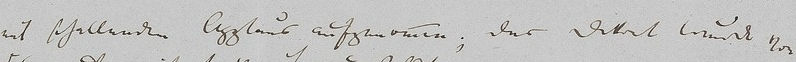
mit schallendem Applaus aufgenommen; das Dekret wurde von
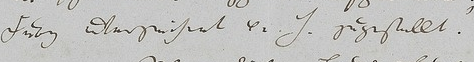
Fuog unterzeichnet &. H. zugestellt.
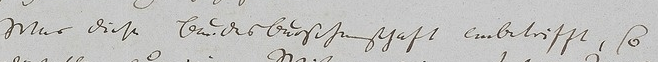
Was diese Bundesburschenschaft anbetrifft, so
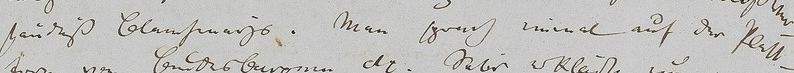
ständniß Blanchenays. Man sprach einmal auf der Platt-
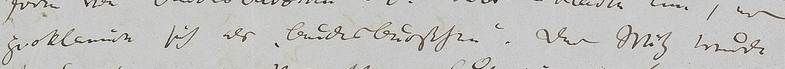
proklamire sich als «Bundesburschen». Der Witz wurde
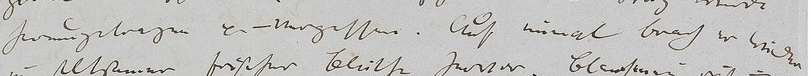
herumgetragen &. – vergessen. Auf einmal brach er wieder
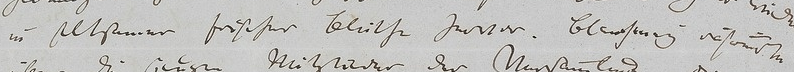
in seltsamer frischer Blüthe hervor. Blanchenay räsonnirte
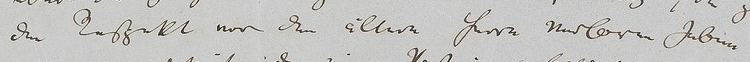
den Respekt vor den ältern Herrn verloren haben.
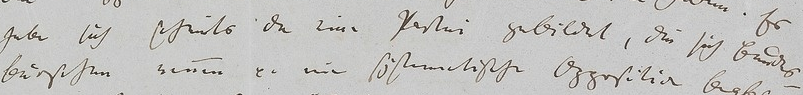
habe sich scheints da eine Partei gebildet, die sich Bundes-
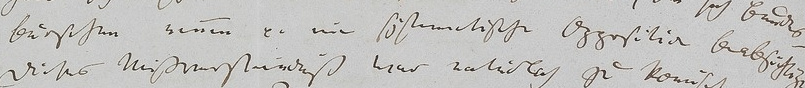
burschen nennen &. eine systematische Opposition beabsichtigen.
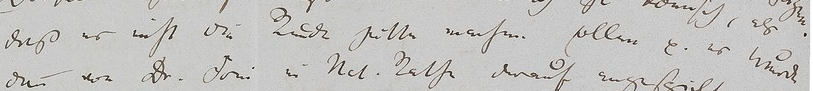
daß es nicht die Runde hätte machen sollen &. es wurde
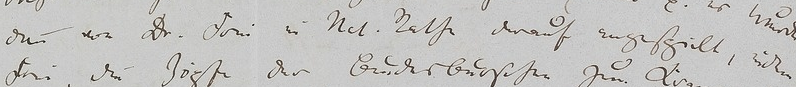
dann von Dr. Frei im Nat.Rathe darauf angespielt, indem
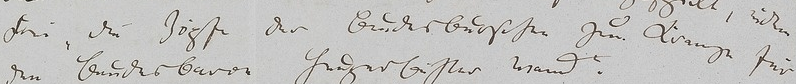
Frei «die Zöpfe der Bundesburschen zum Kranze für
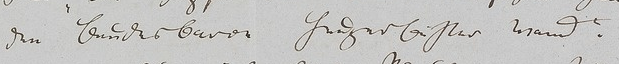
den Bundesbaron Hungerbühler wand.»
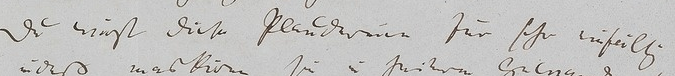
Du wirst diese Plaudereien für sehr einfältig
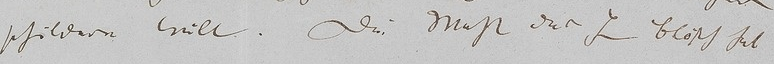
schildern will. Die Wahl des Herrn Blösch hat
